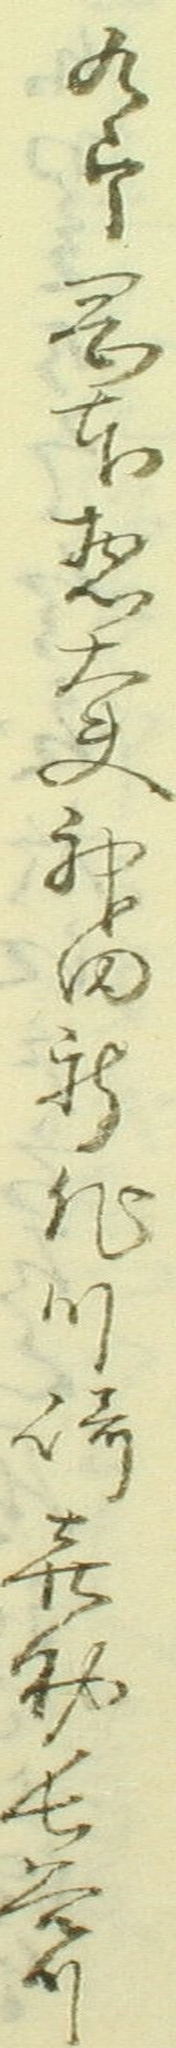九郎岡本惣太夫神田新作川崎喜助長谷川
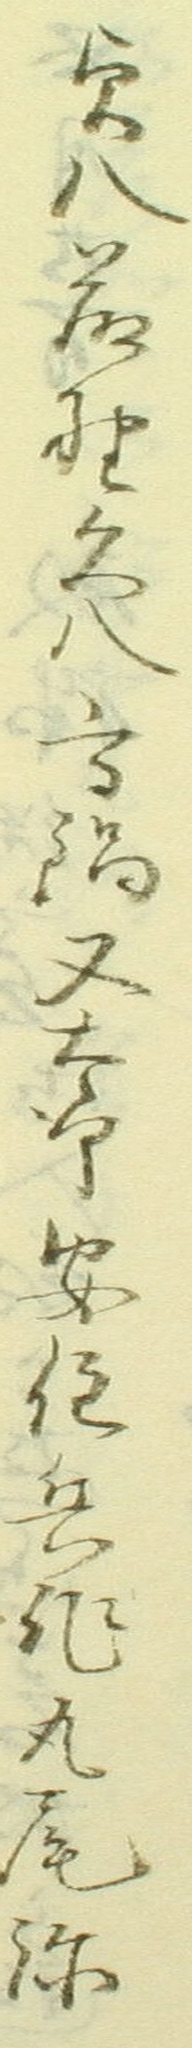貞八籐野久八高隅又太郎安住兵作丸尾弥
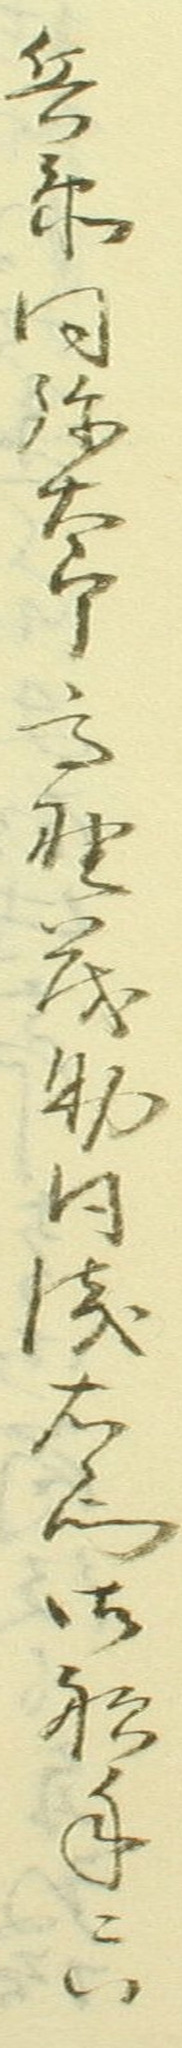兵衛同弥太郎高野茂助同儀右衛門御船手には
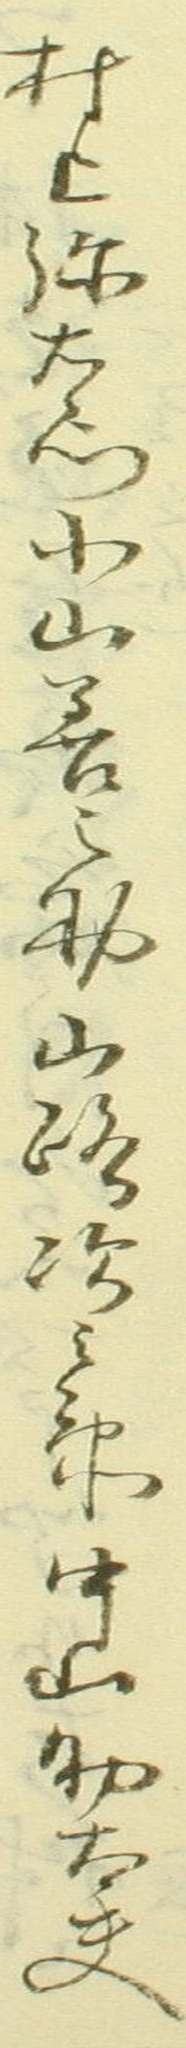村上弥右衛門小山善之助山路次兵衛中山助太夫
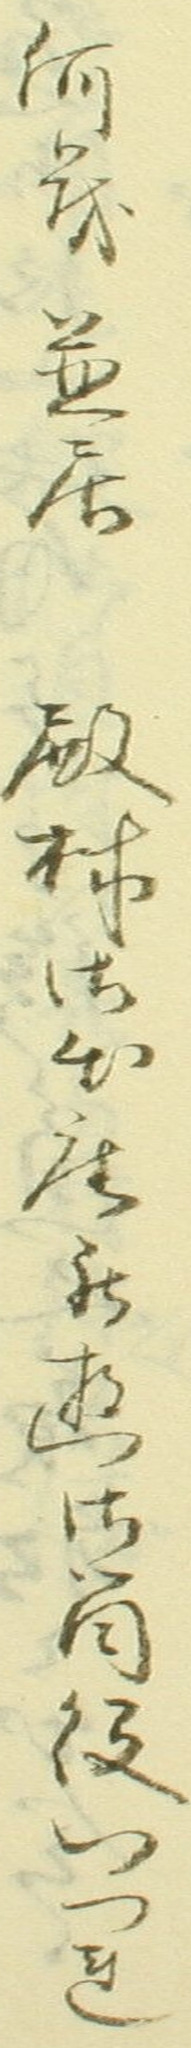何茂並居殿様御出座被遊御筒役いつれ
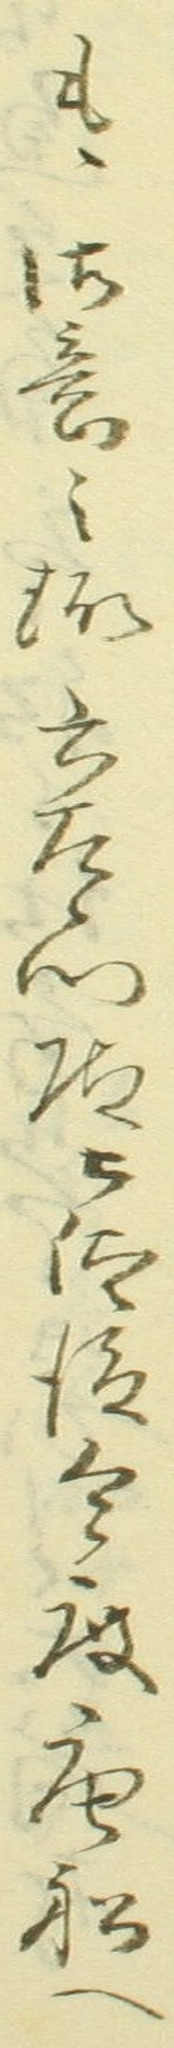も御意之趣六左衛門殿被仰後今度唐船へ
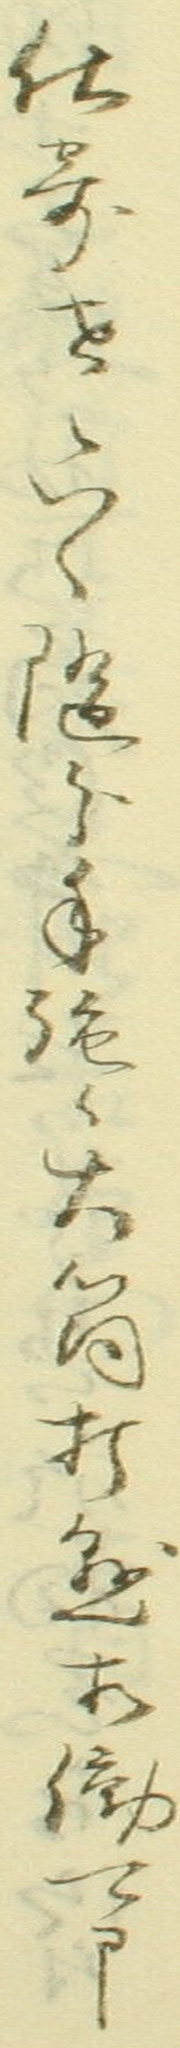仕寄せ候はは随分手強く大筒打懸相働可申
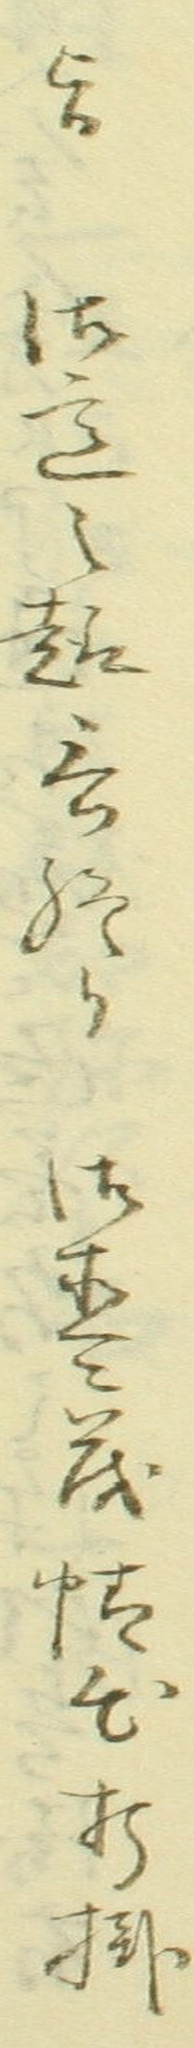旨御適之趣言終り御直にも情無打掛
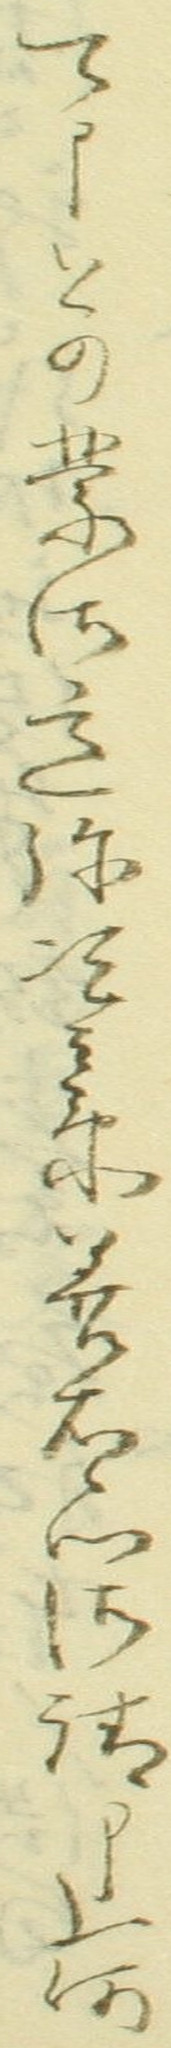可申との蒙御適弥次兵衛善右衛門御請申上何
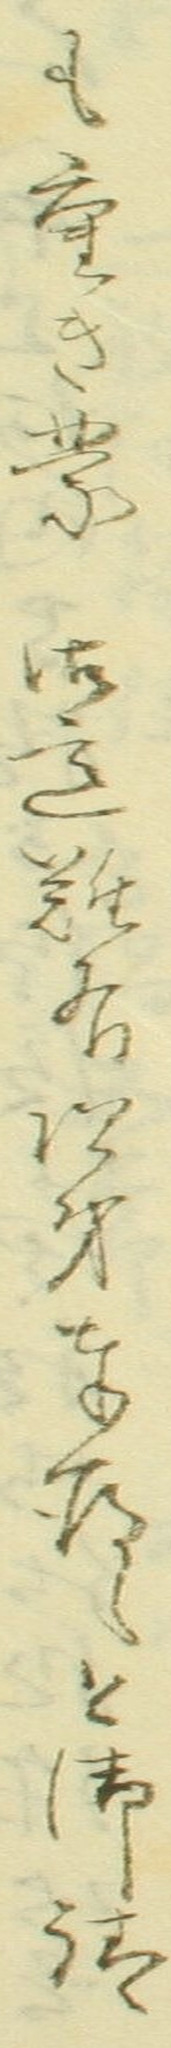も重き蒙御適有次第奉存候と御請
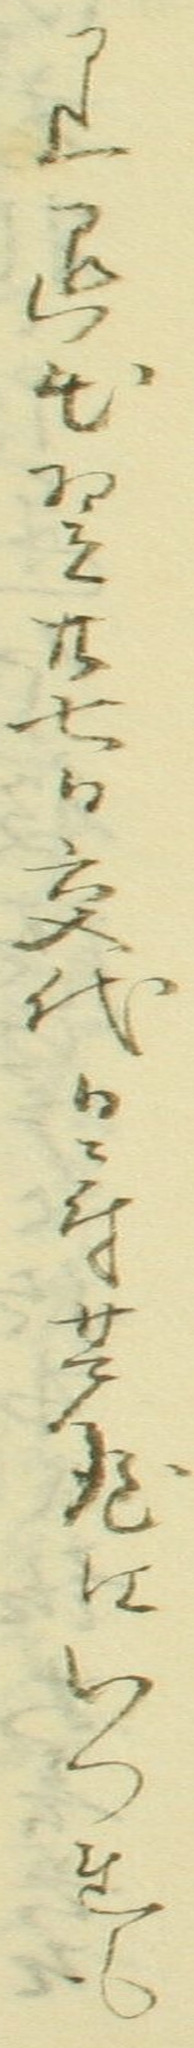申上退出翌廿七日交代日に付芦屋江いつれも

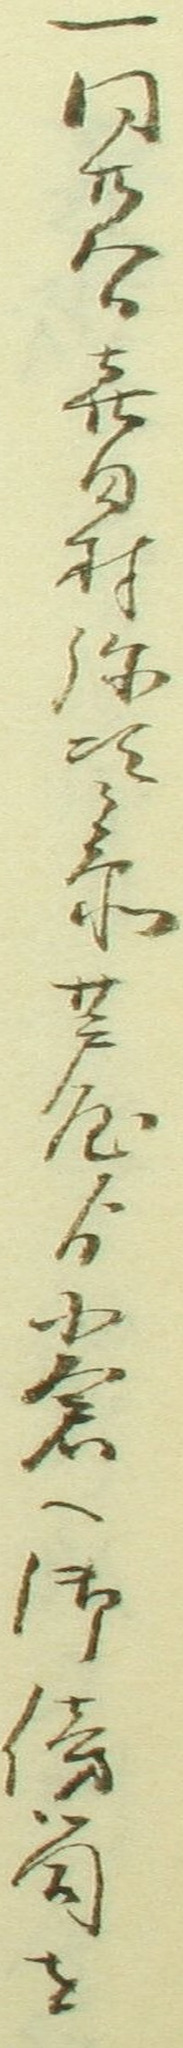一同廿八日喜多村弥次兵衛芦屋ゟ小倉へ御傍筒を
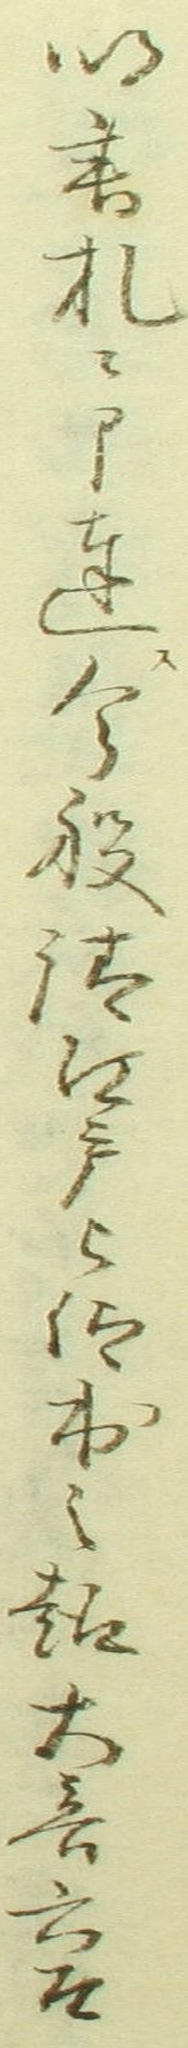以書札に申達す今般請江戸被仰出之趣大音六左
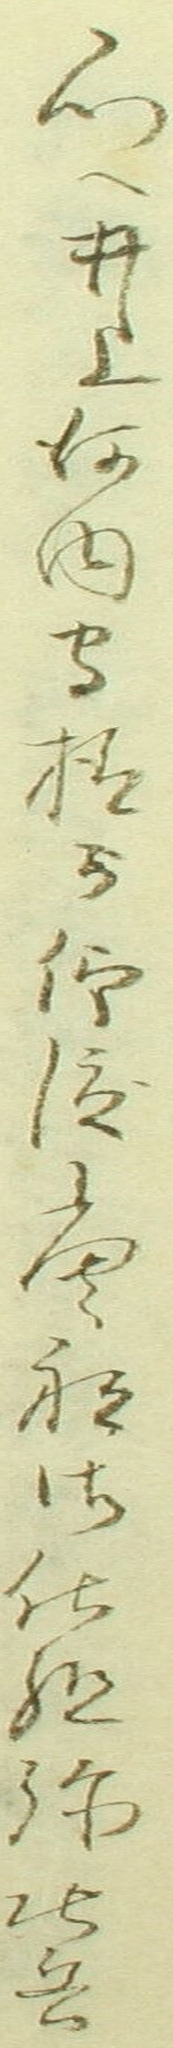衛門へ井上河内守様被仰渡之唐船御仕組弥次兵
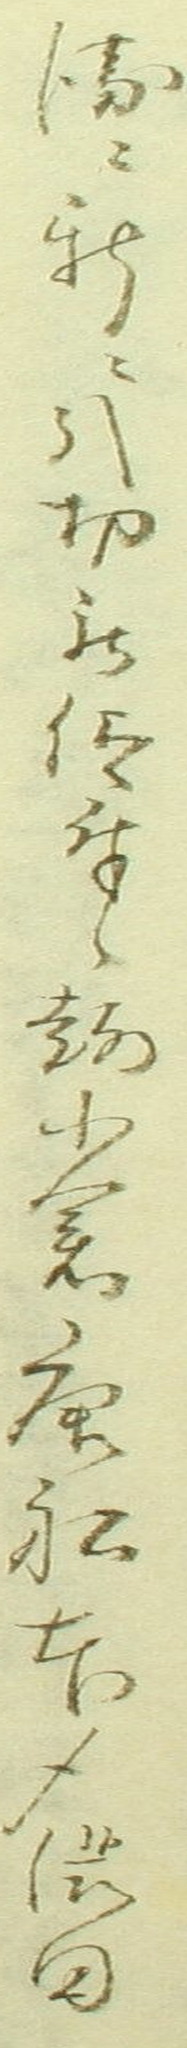衛に新に引切被仰付候趣小倉唐船本〆？田
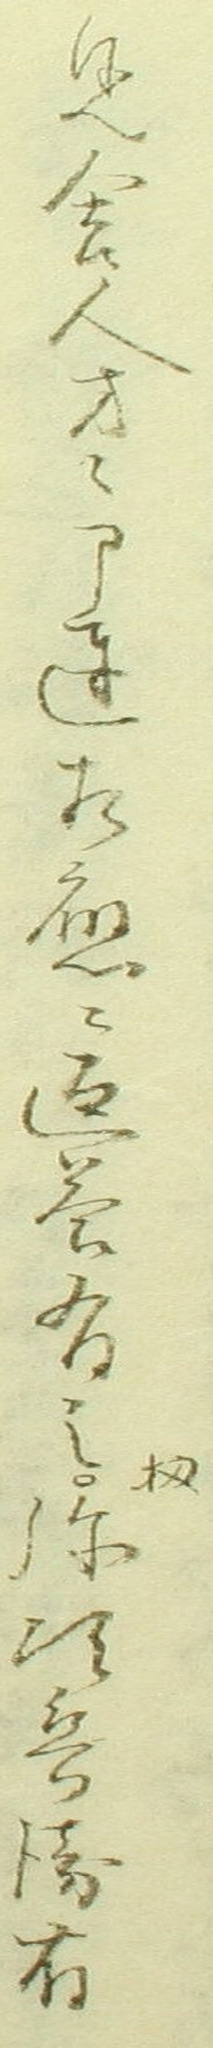息舎人方々申達相応に返答有之扨弥次兵衛有
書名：唐船漂流記 四
